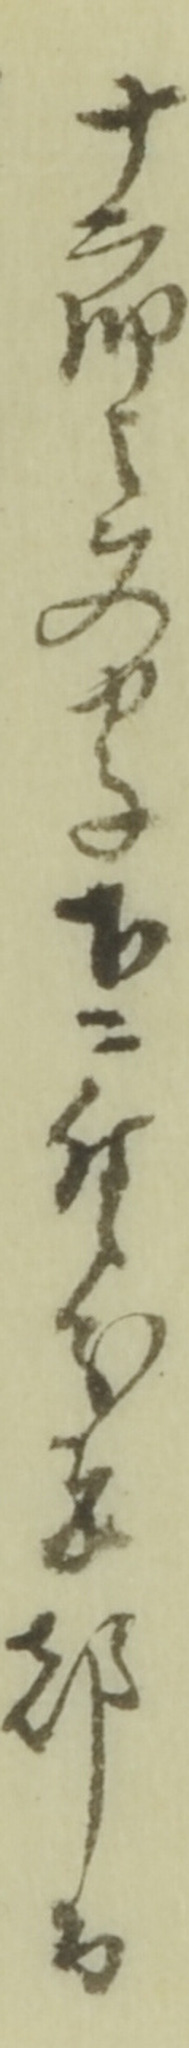十郎の文字下二付候義者都而
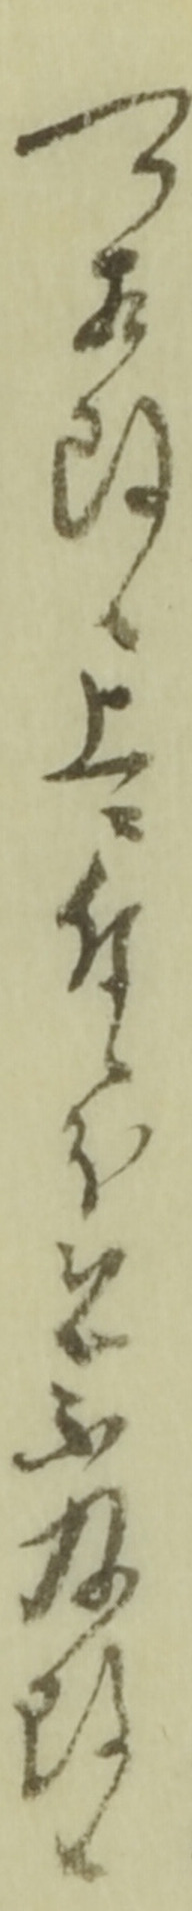可相改候上二付候分者不及改候
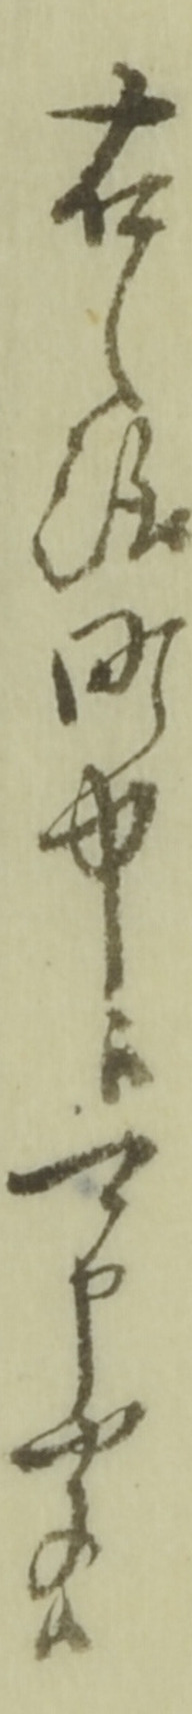右之趣町中え可申聞候
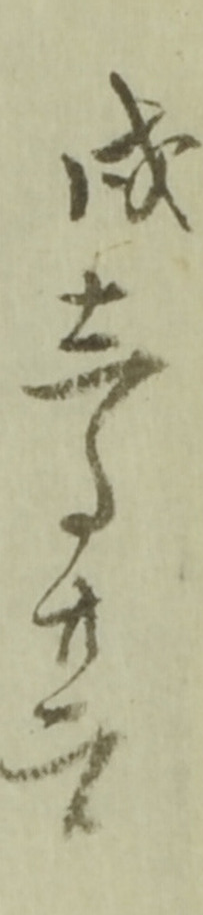戌十二月廿二日

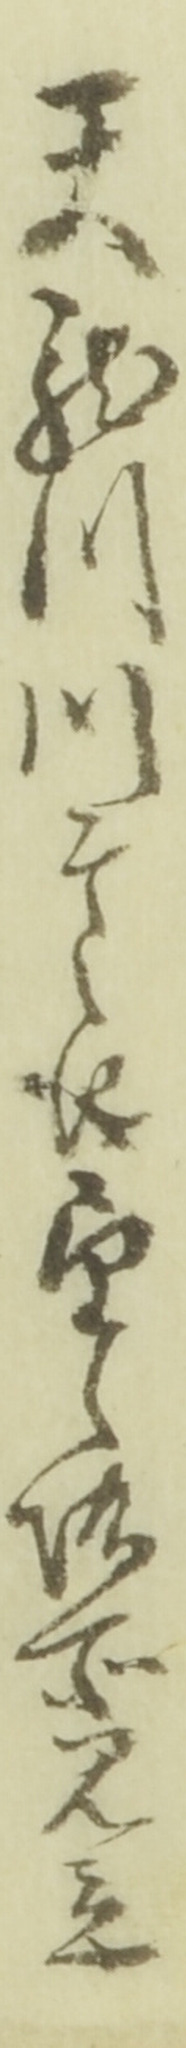天竜川川上候儀届之場所見立
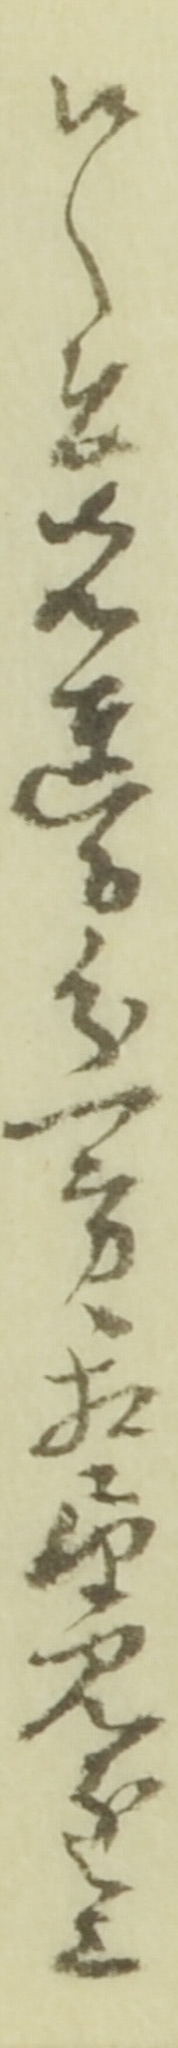候之者先達而分一方へ相届見遂候迄
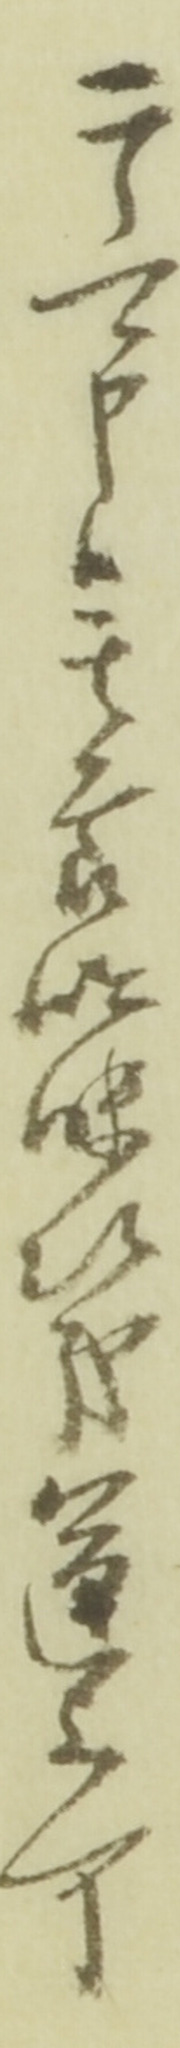二可申候其節御吟味次第運上可
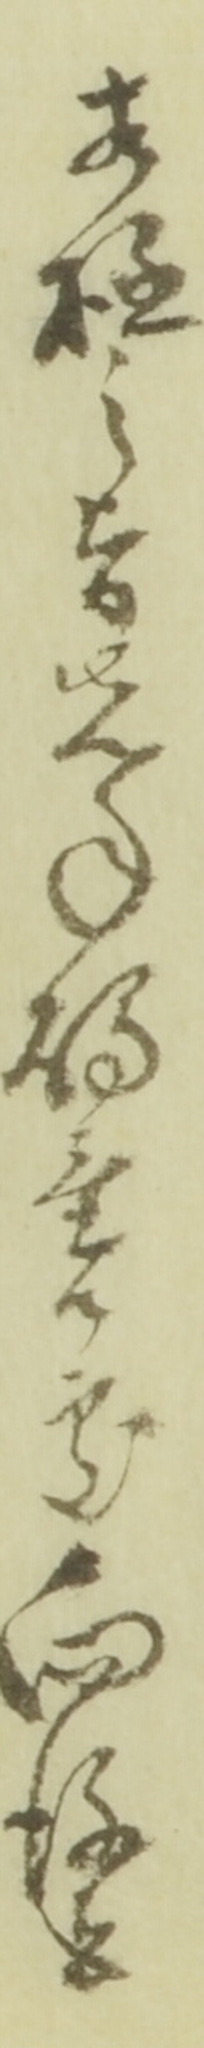相極之旨先年破置候處向後者
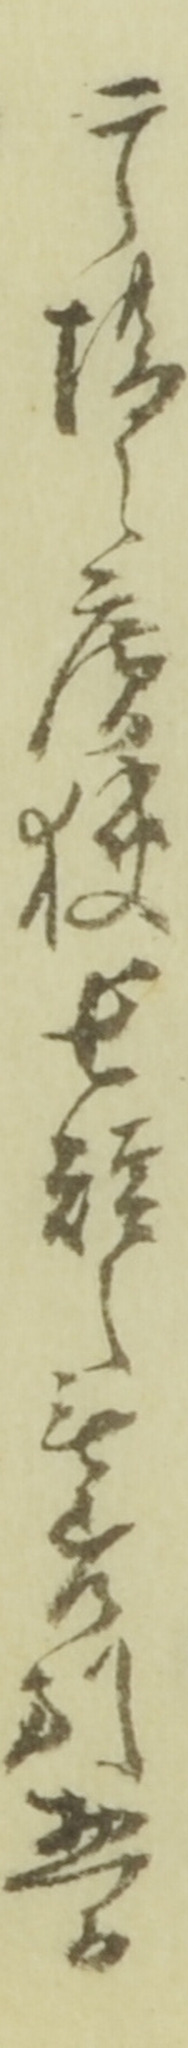其場之廣狭量難候無差別惣而
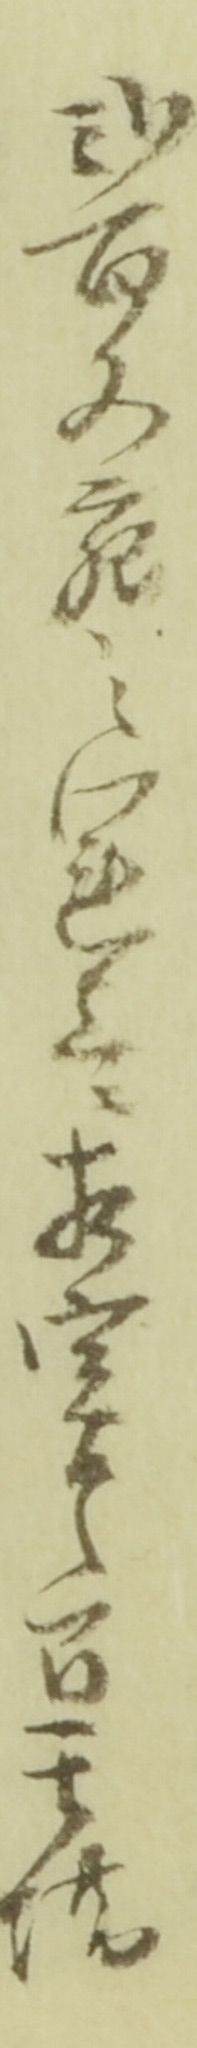弐百文宛之運上二相定而候間其場
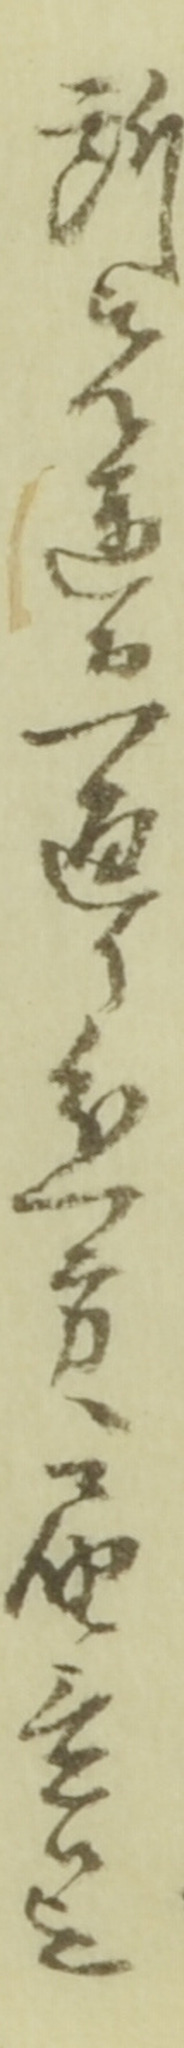所先達而可通候近方へ届置候迄
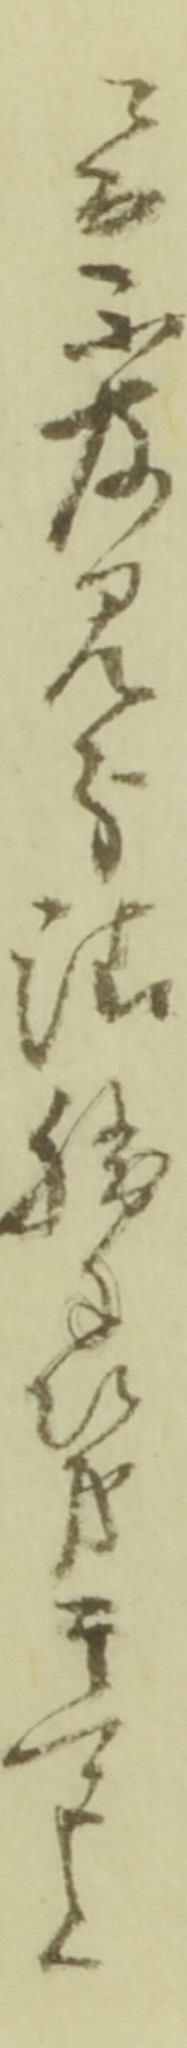二而不及見分法勝手次第与可申候
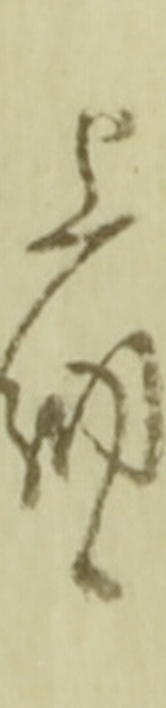上納候
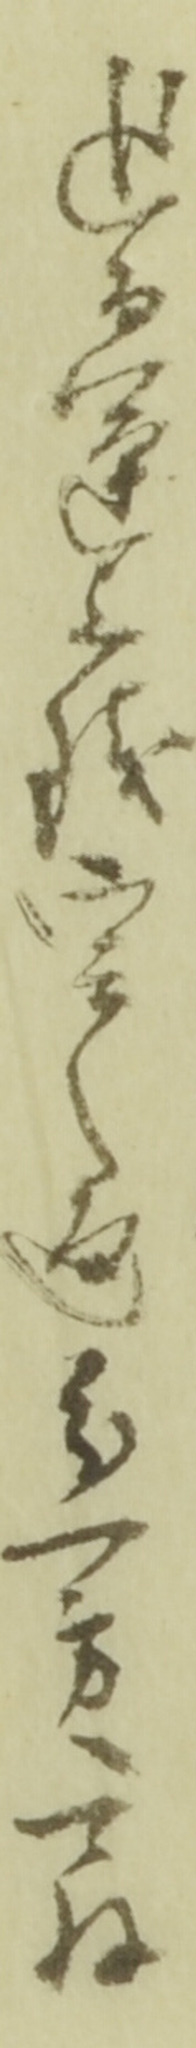追而運上銭定之通分一方へ可為
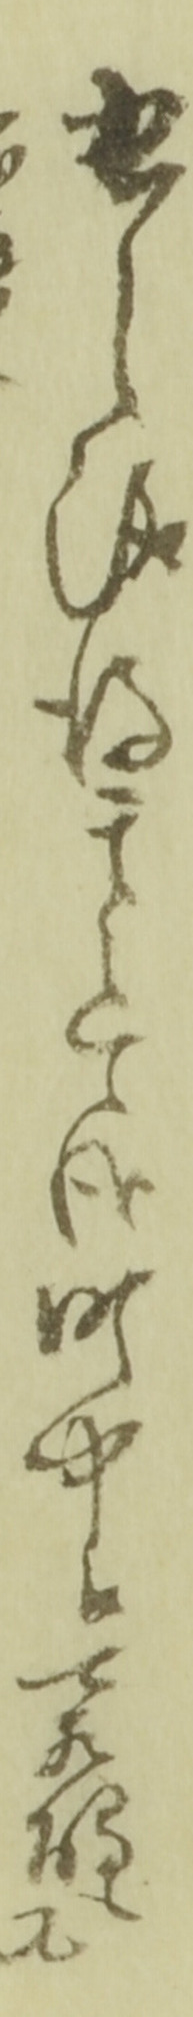右之趣得其意候儀町中え可相触候以上
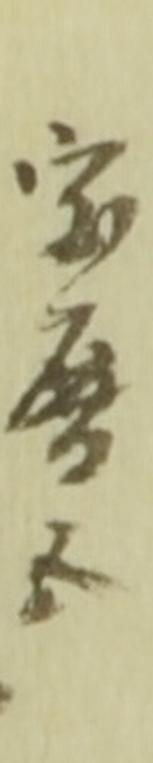宝暦五
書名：御公儀様御領主様御触書控
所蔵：伊那市立高遠町図書館・合同会社AMANE
